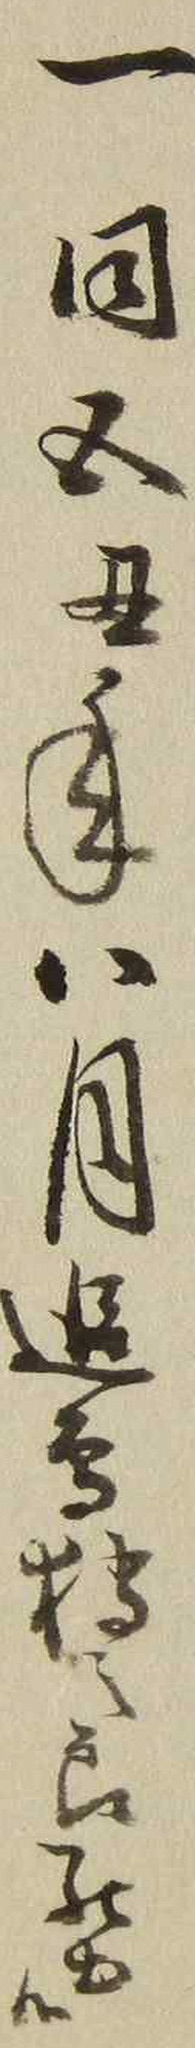一同五丑年八月追鳥狩之節罷出候
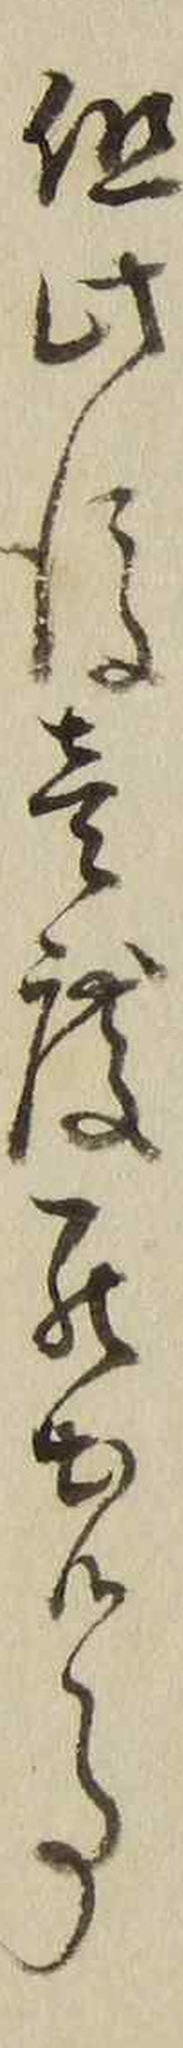但此後壱度罷出候事
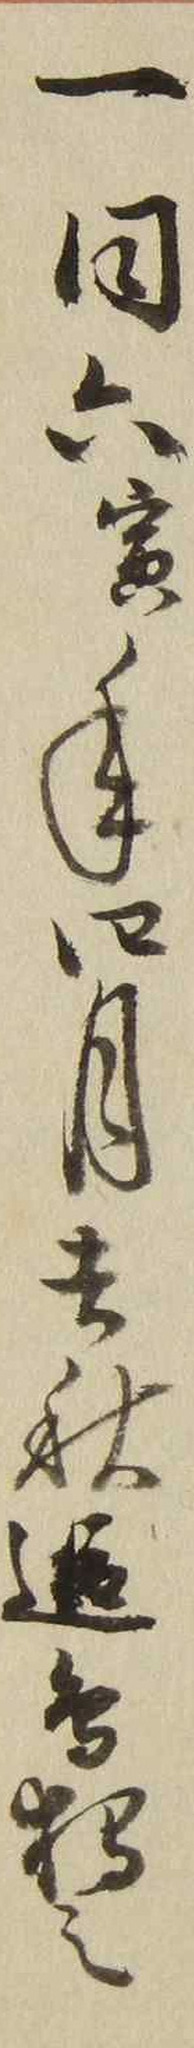一同六寅年四月去秋追鳥狩之

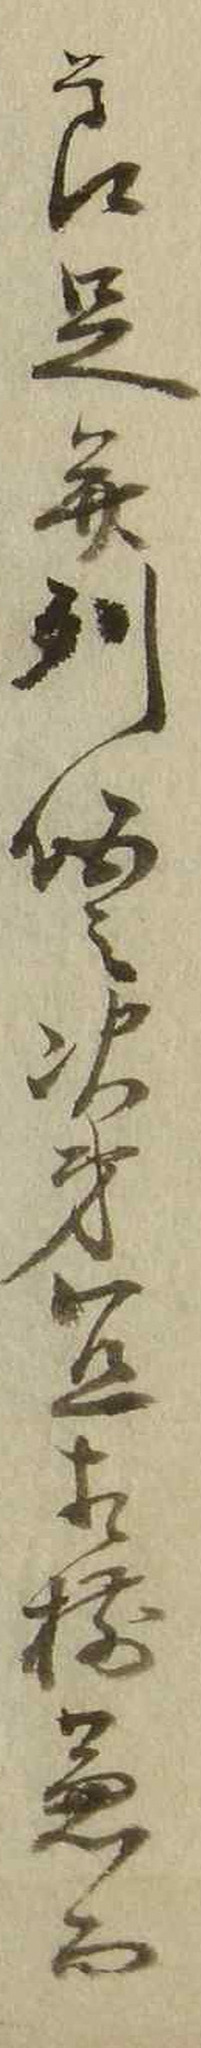節足幷列伍之次第宜相揃兼而
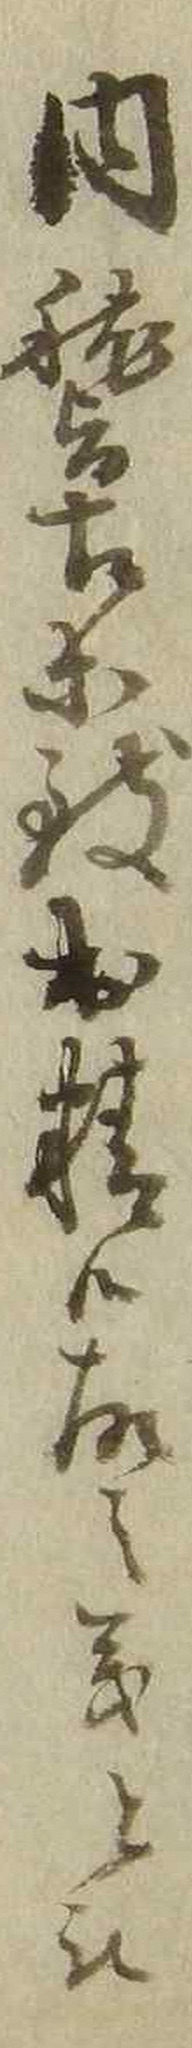内稽古等致出精候故之義と被
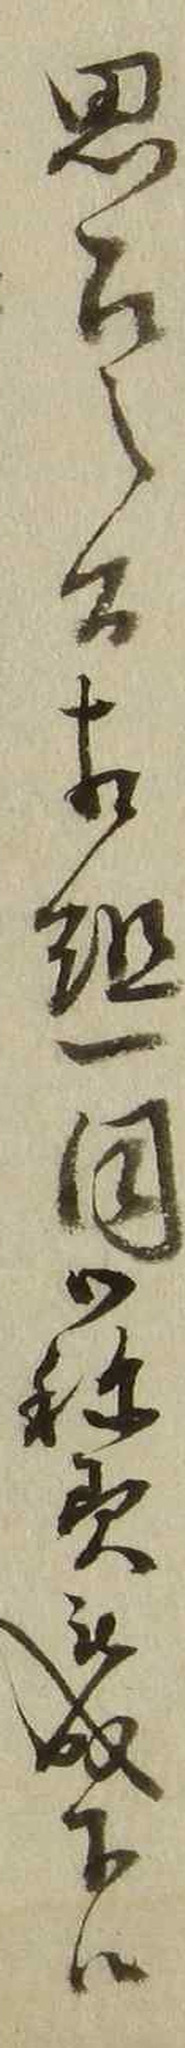思召之旨相組一同御称美被成下候
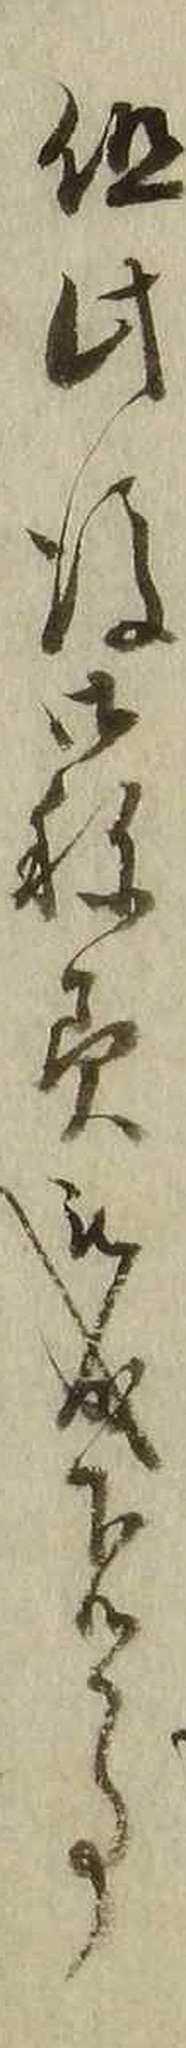但此後御称美被成下候事
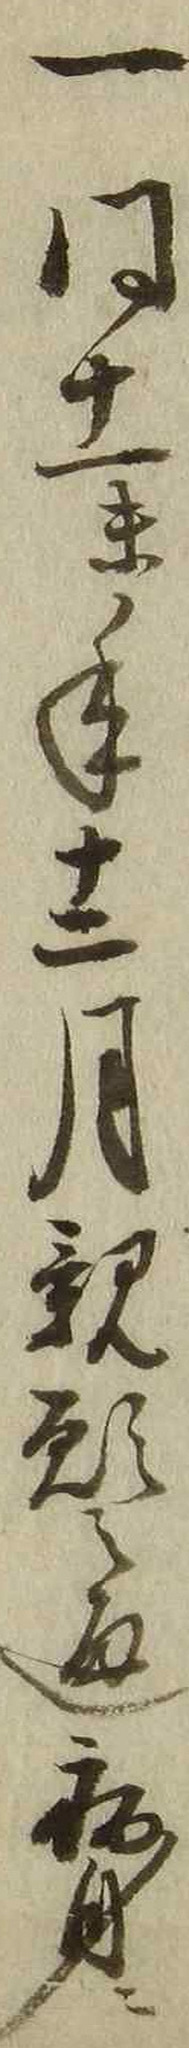一同十一未年十二月親願之通病身ニ
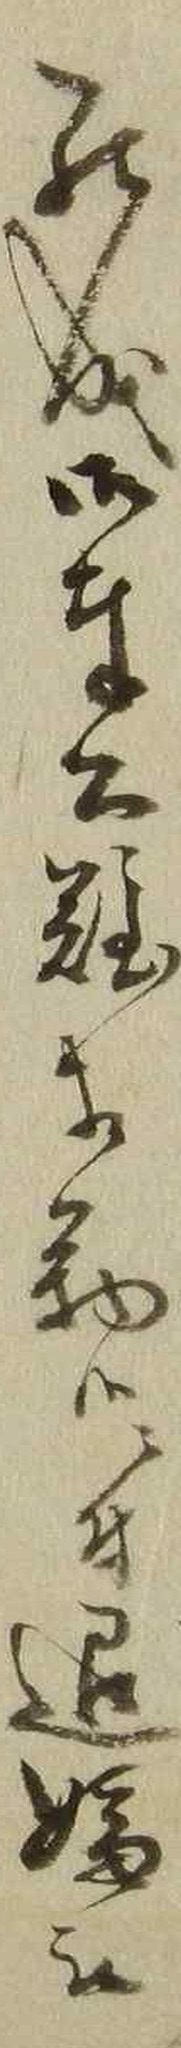罷成御奉公難相勤候ニ付退嫡被
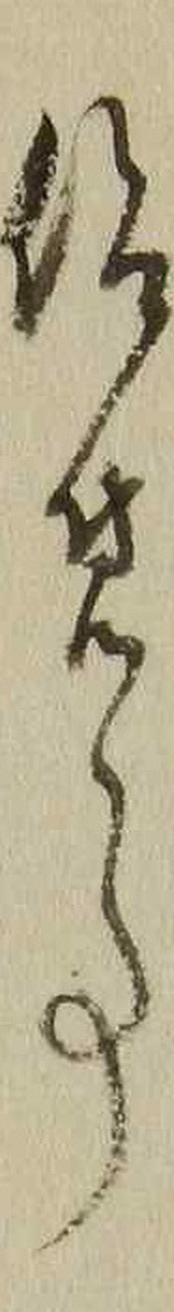仰付候事
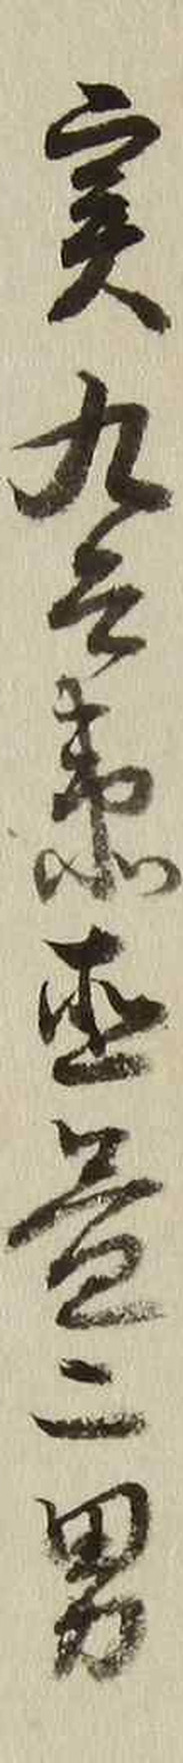実九兵衛直益二男
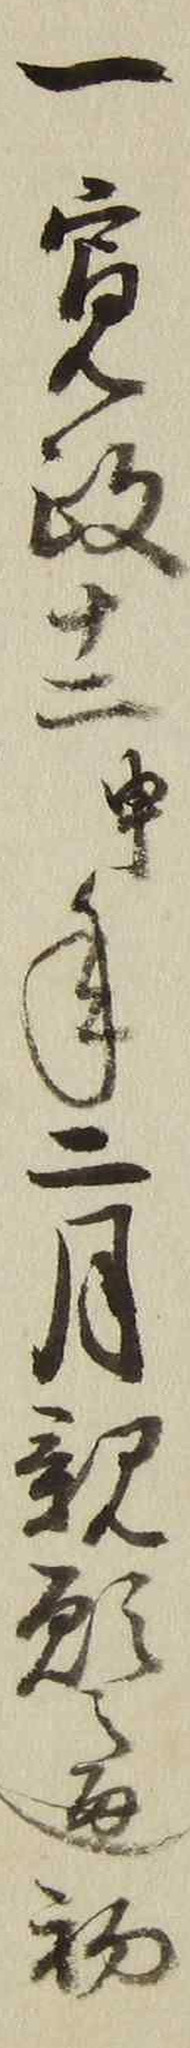一寛政十二申年二月親願之通初
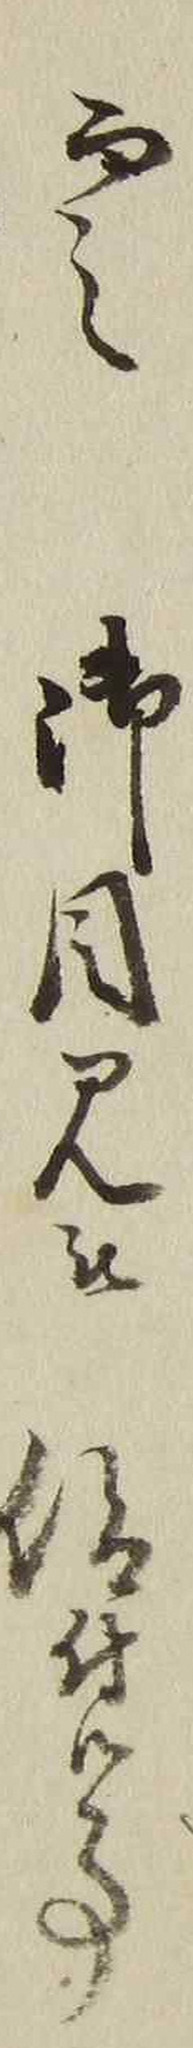而之御目見被仰付候事
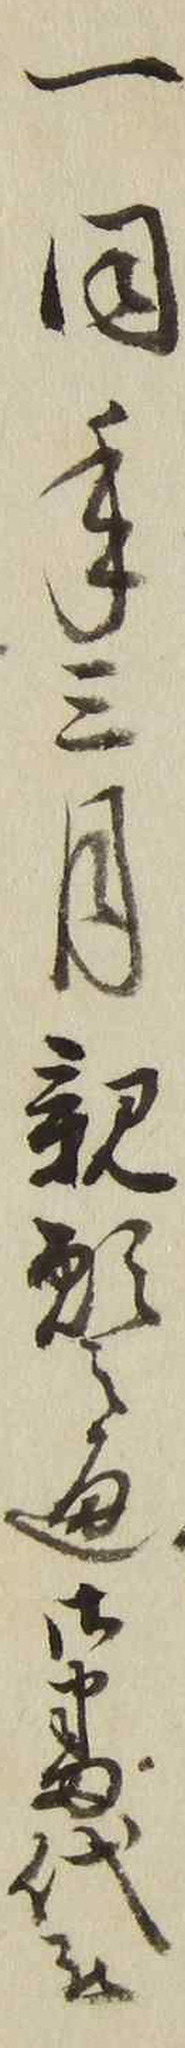一同年三月親願之通御番代被
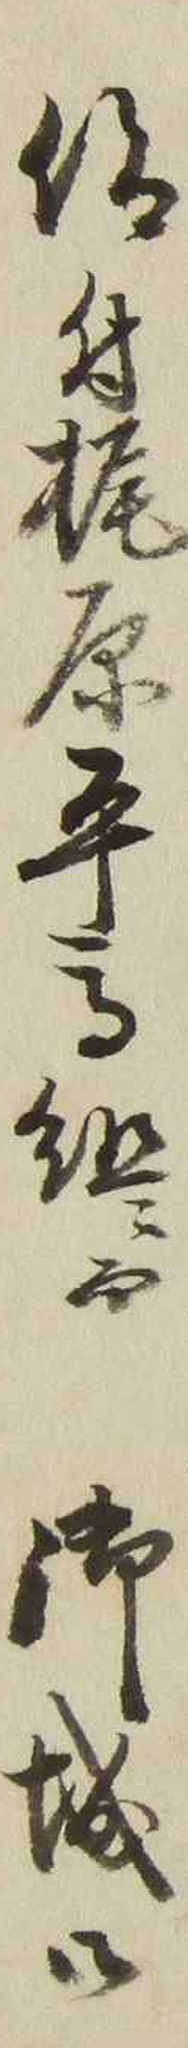仰付梶原平馬組ニ而御城御

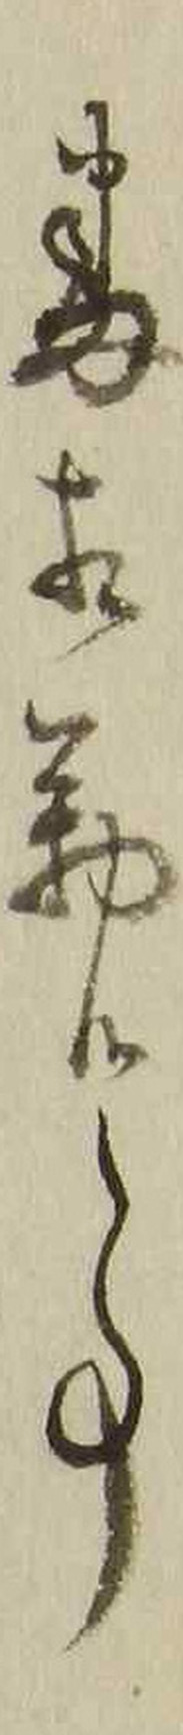番相勤候事
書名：諸士系譜　巻之53　に之部4
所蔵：会津若松市立会津図書館
